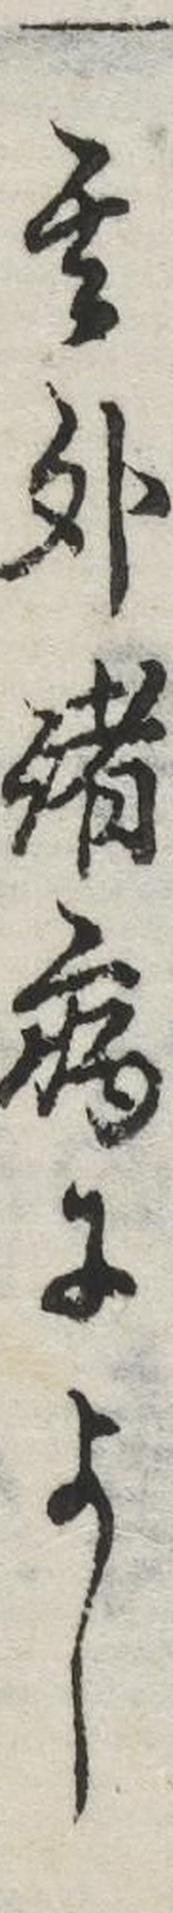其他諸病によし
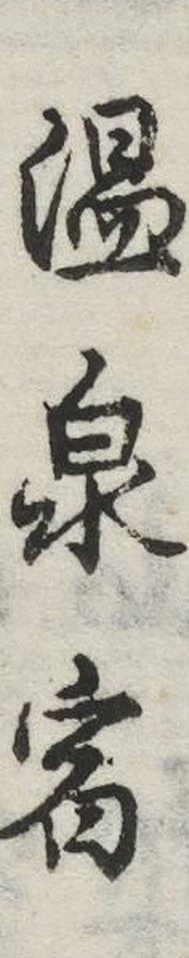温泉宿
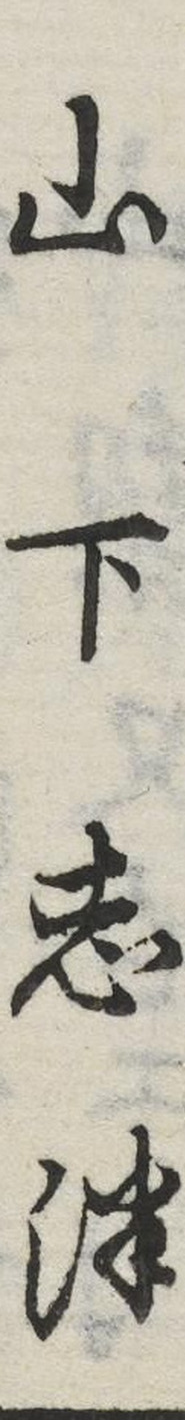山下志津
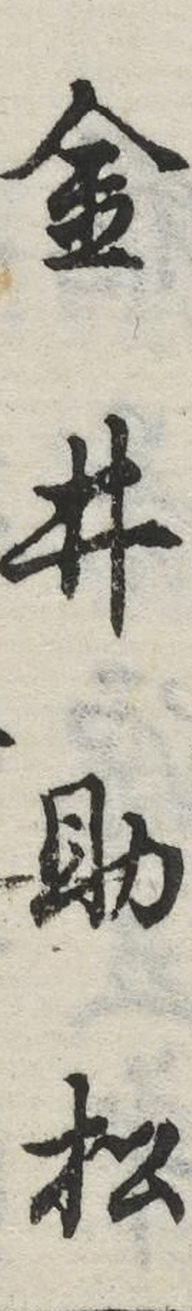金井助松
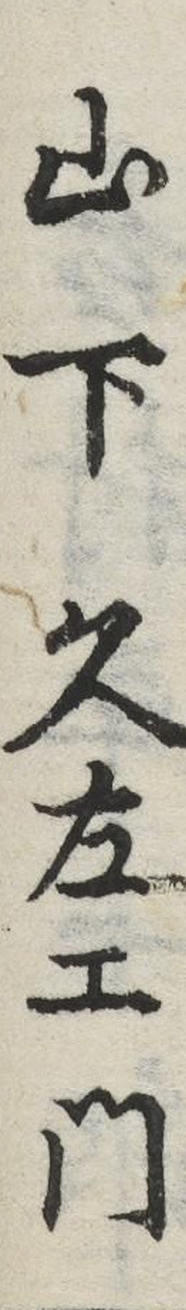山下久左衛門

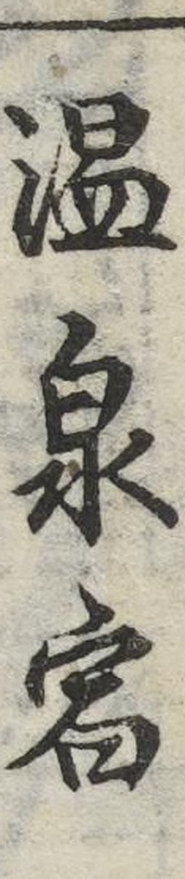温泉宿
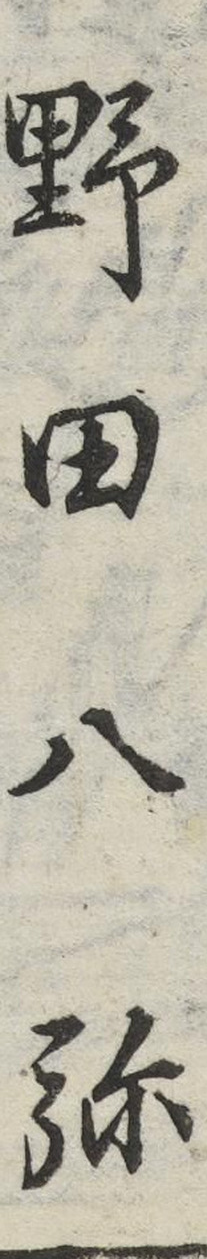野田八弥
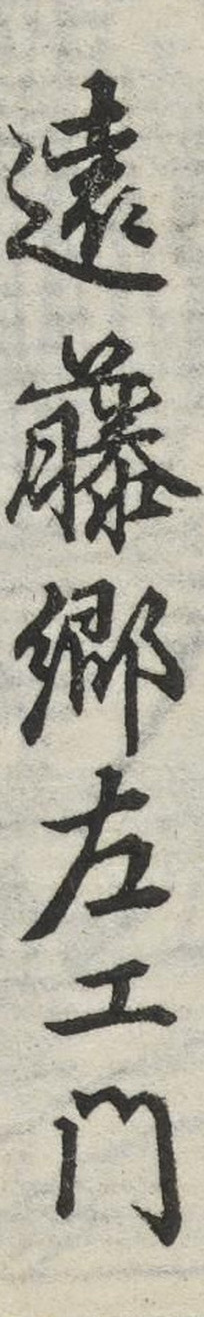遠藤郷左エ門
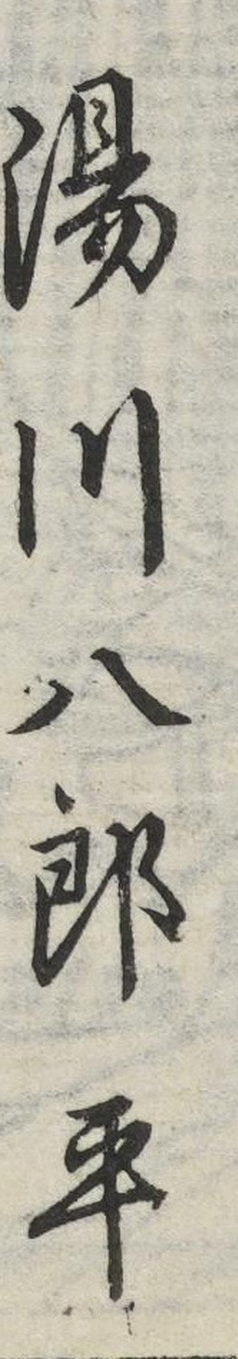湯川八郎平
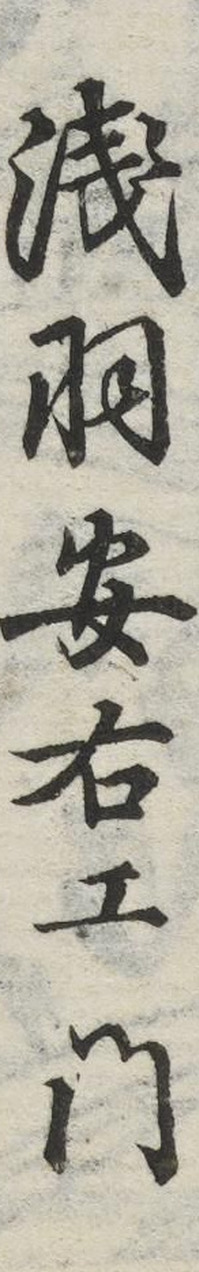浅羽安右エ門
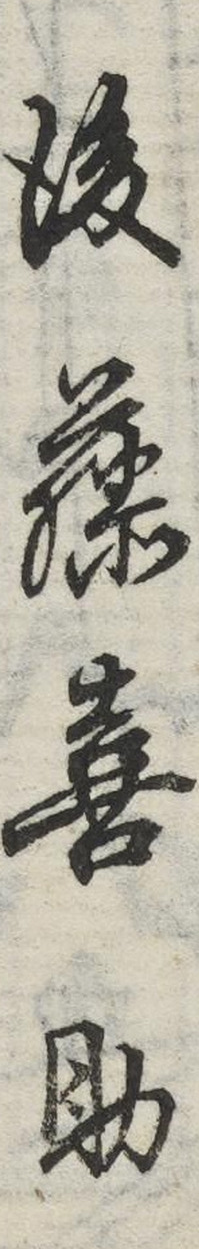後藤喜助
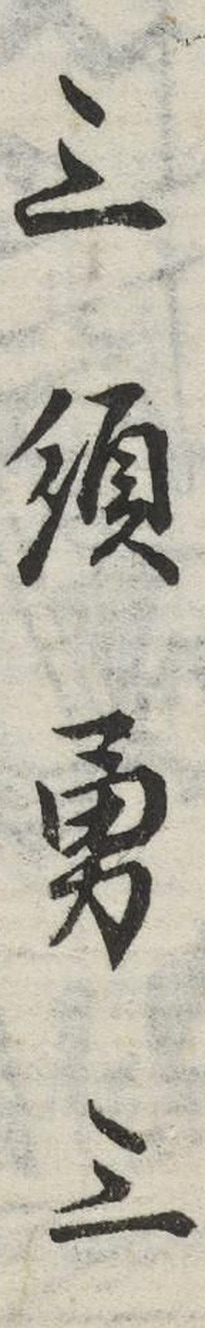三須勇三
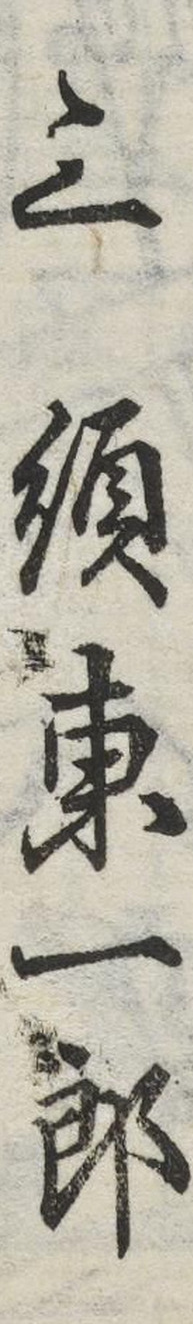三須東一郎
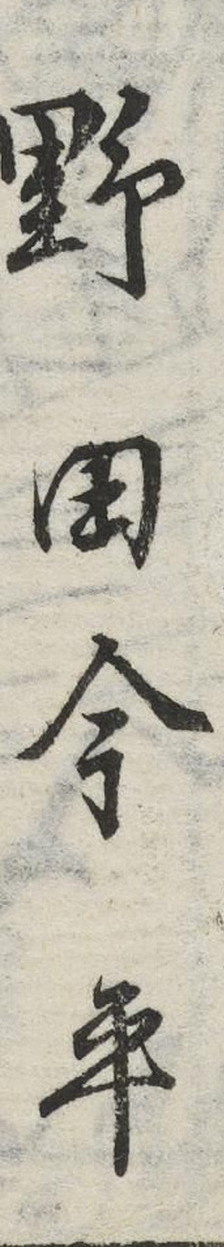野田今平
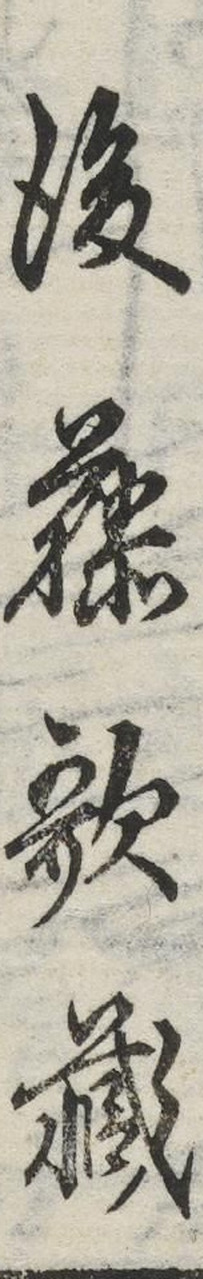後藤歌蔵
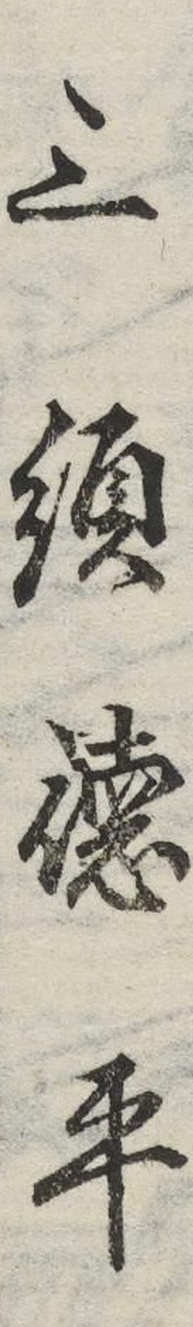三須徳平
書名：諸國温泉遊覽記　全
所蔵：東京大学地震研究所図書室 Earthquake Research Institute Library, The University of Tokyo, JAPAN
